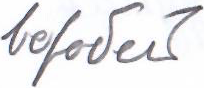воробей
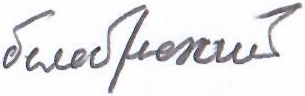белобрюхий
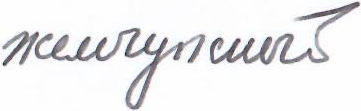жемчужный
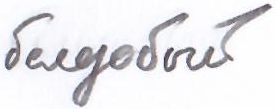белозобый
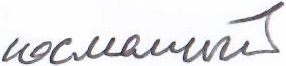косматый
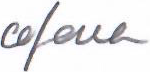сорока
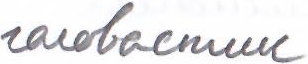головастик
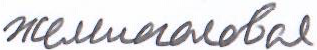желтоголовая
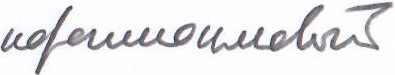короткоклювый
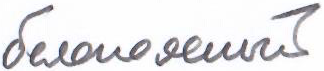белопоясный
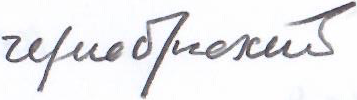чернобрюхий
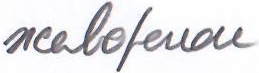жаворонок
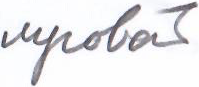луговой
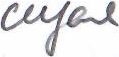сизая
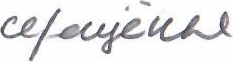серощёкая
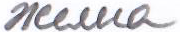желна
